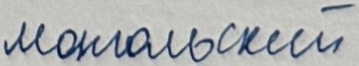монгольский
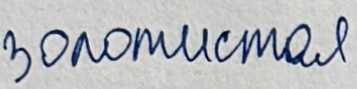золотистая
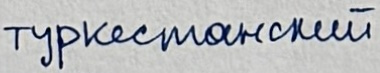туркестанский
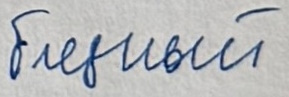бледный
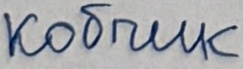кобчик
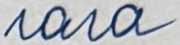гага
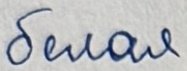белая
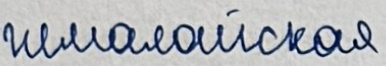гималайская
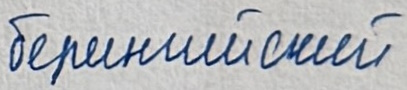берингийский
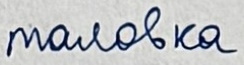таловка
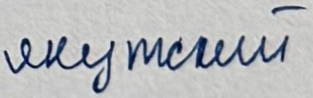якутский
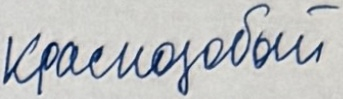краснозобый
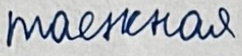таежная
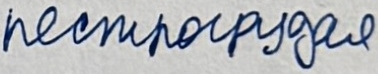пестрогрудая
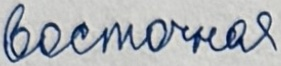восточная
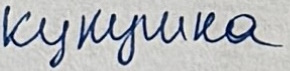кукушка
